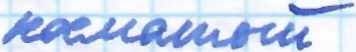косматый
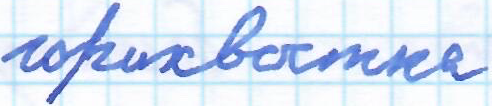горихвостка
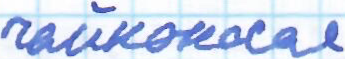чайконосая
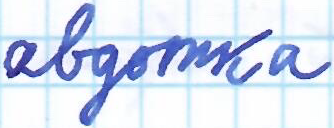авдотка
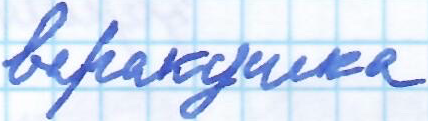варакушка
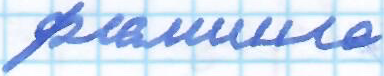фламинго
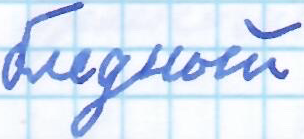бледный
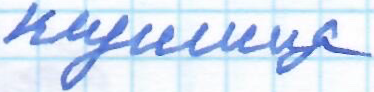клушица
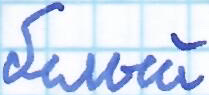белый
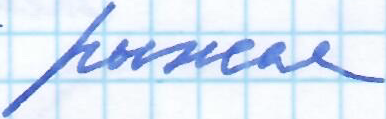рыжая
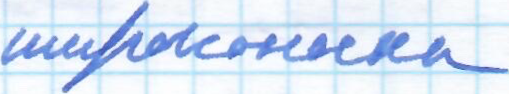широконоска
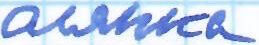оляпка
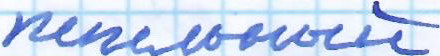пепельный
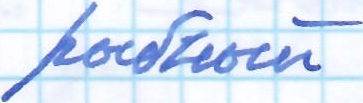рыбный
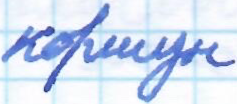коршун
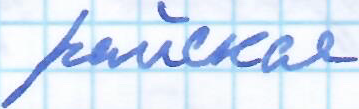райская
